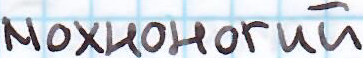мохноногий
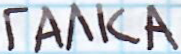галка
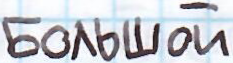большой
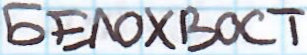белохвост
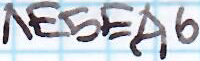лебедь
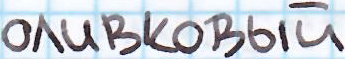оливковый
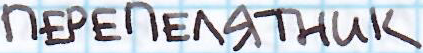перепелятник
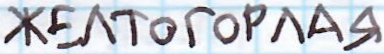желтогорлая
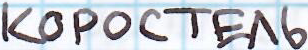коростель
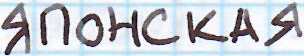японская
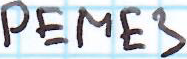ремез
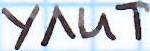улит
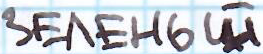зеленый
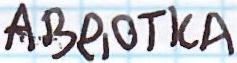авдотка
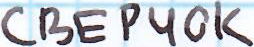сверчок
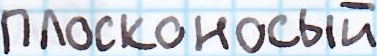плосконосый
